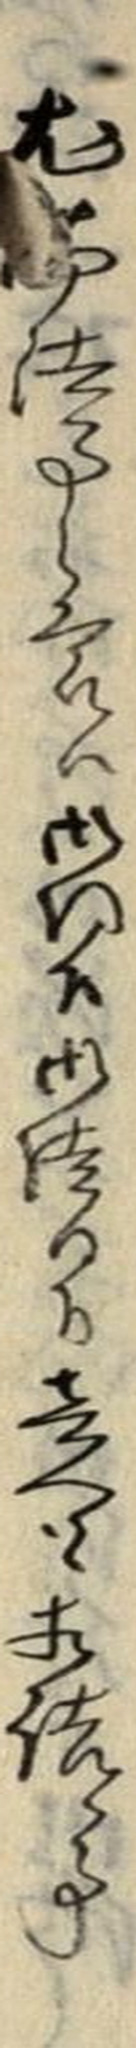尤御法事之節は御目付御徒目付壱人ツヽ相詰候事
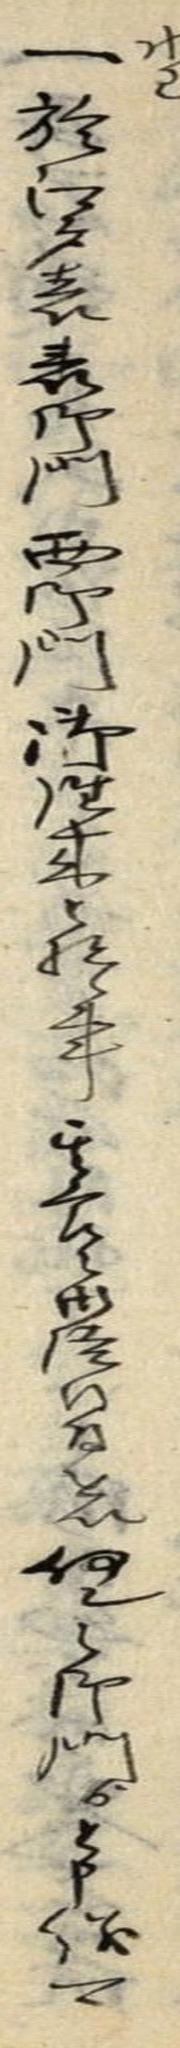一於江戸表表御門西御門御往来被遊候事其節に御徒目付を以何れ之御門ゟと申儀可
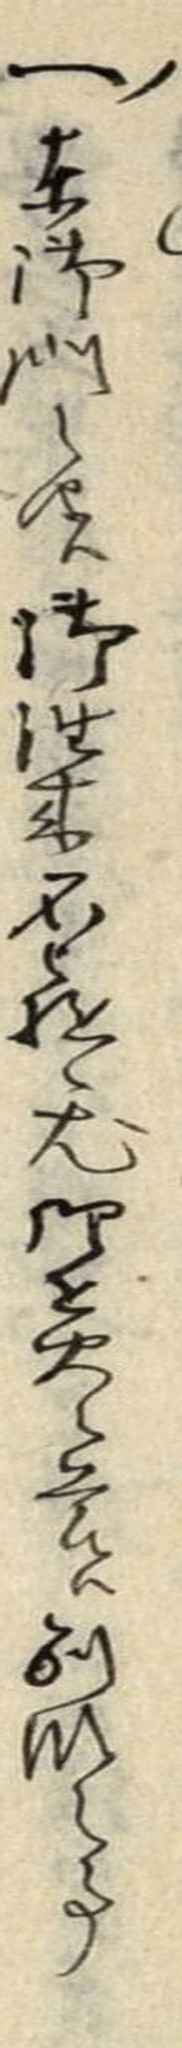一東御門之儀は御往来不被遊候尤御近火之節は別段之事
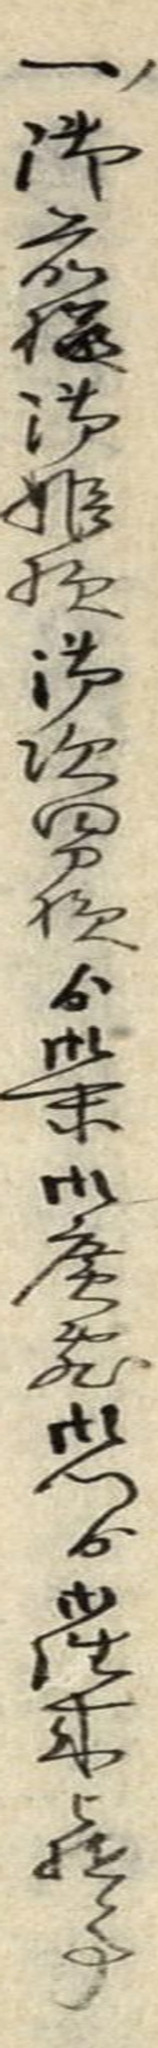一御前様御姫様御次男様ゟ御末御広敷御門ゟ御往来被遊候事
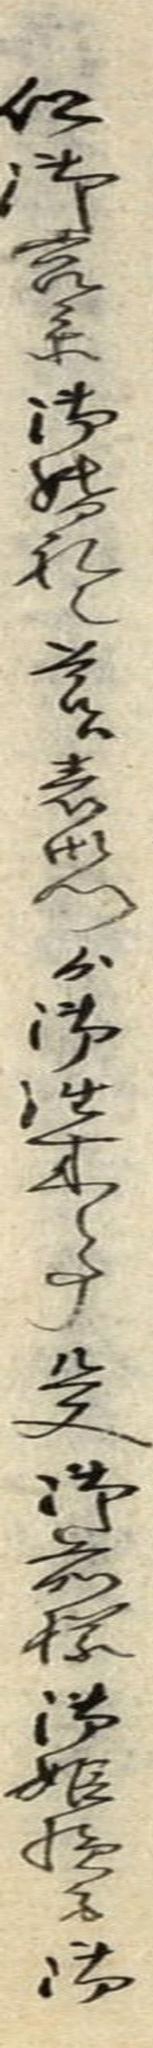但御宮参御婚礼之節は表御門ゟ御往来之事且又御前様御姫様方御
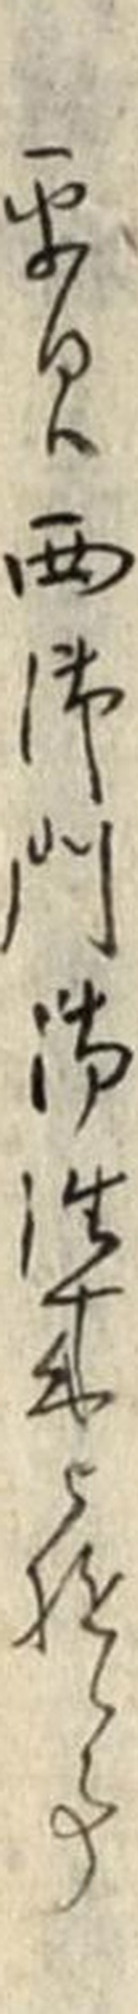平日は西御門御往来被遊候事
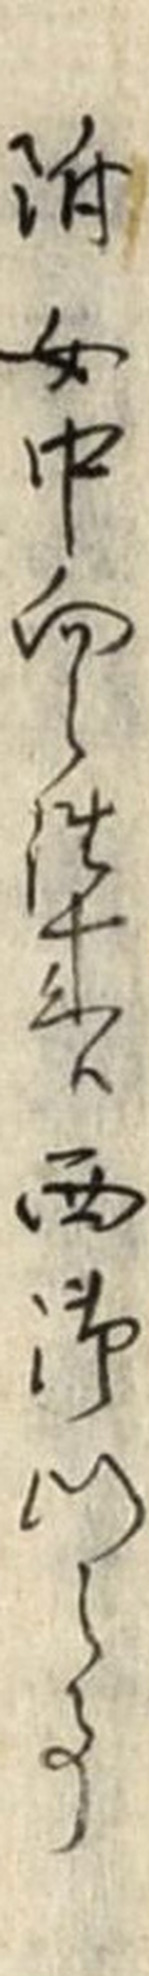附女中向之往来は西御門之事
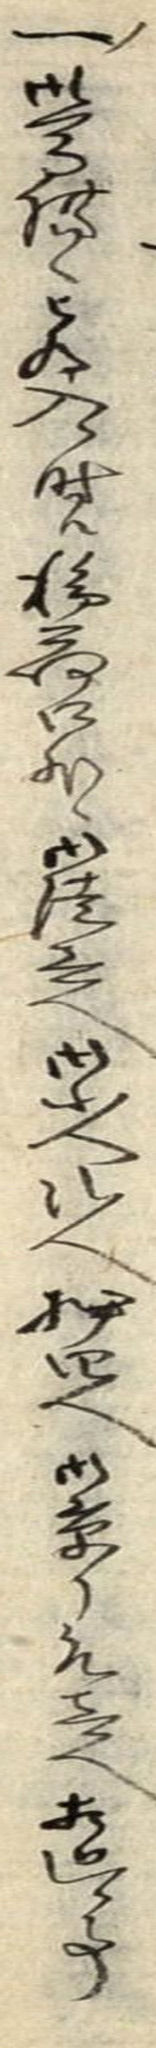一御馬場へ被為入候時は稲荷口外へ御徒壱人御小人弐人押四人御草り取壱人相廻候事
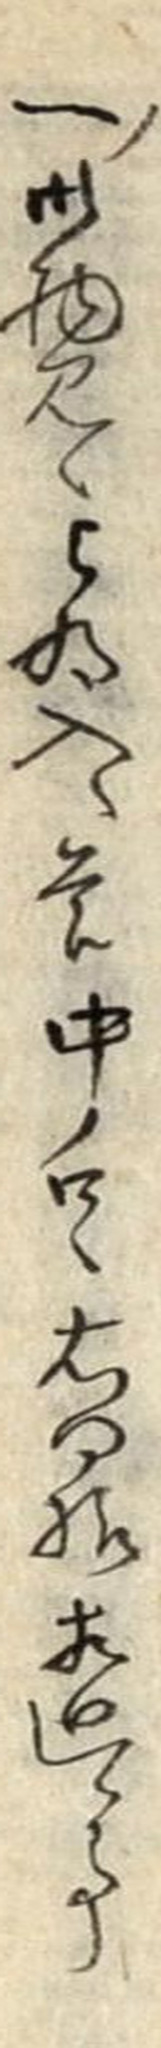一御物見へ被為入候節中の口へ右同様相廻候事
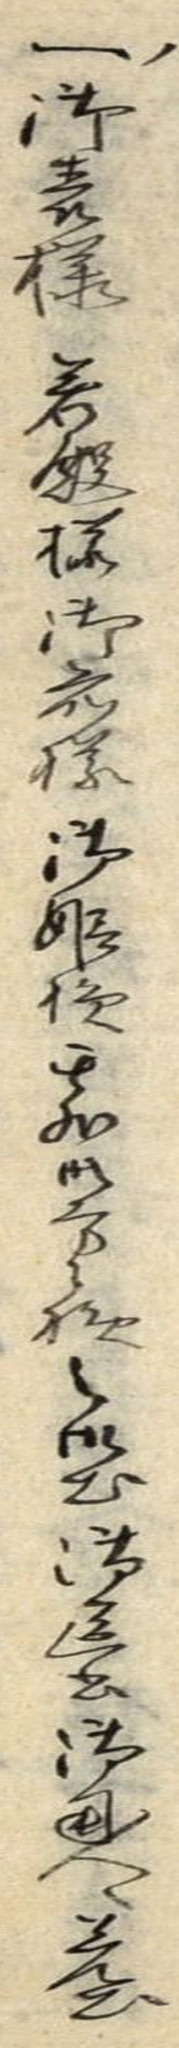一御表様若殿様御前様御姫様其外御方々様之御出御道書御用人へ差出

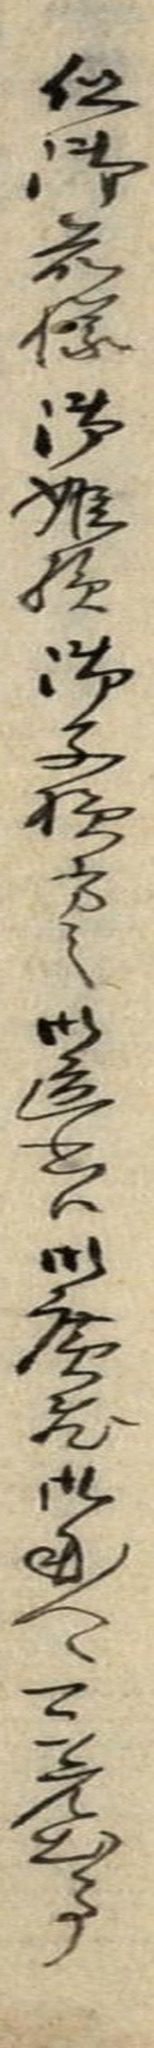但御前様御姫様御子様方之御道書は御広敷御用人へ可差出事
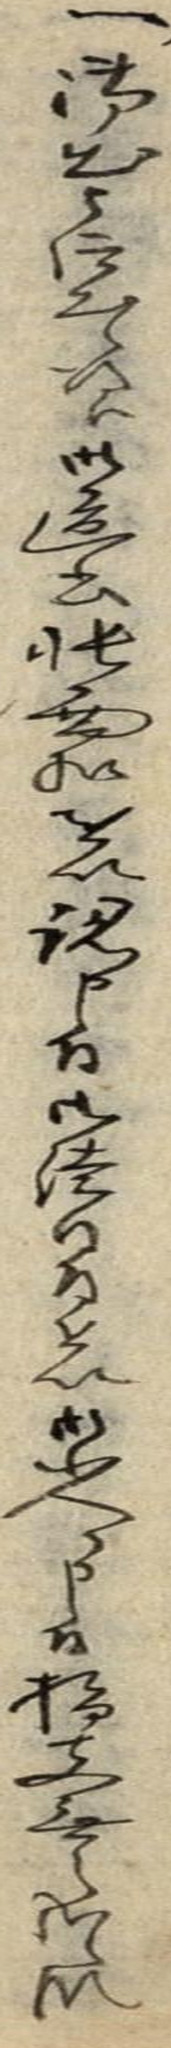一御出被仰出候得は御道書帳面扣を以認申付御徒目付を以御小人へ申付指支無之哉之段
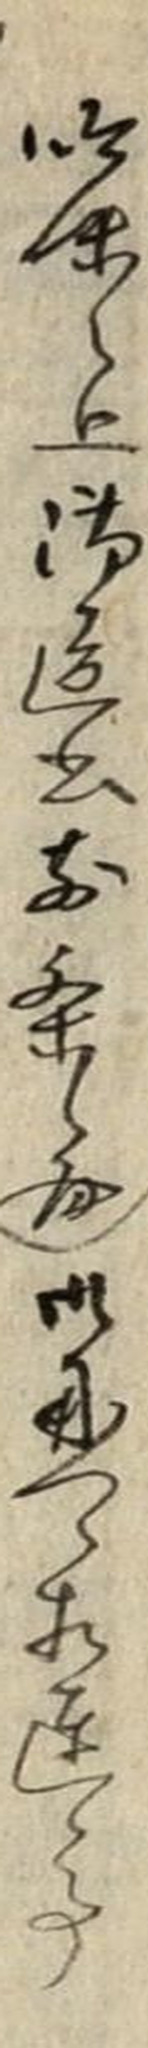吟味之上御道書前条之通御用人へ相達候事
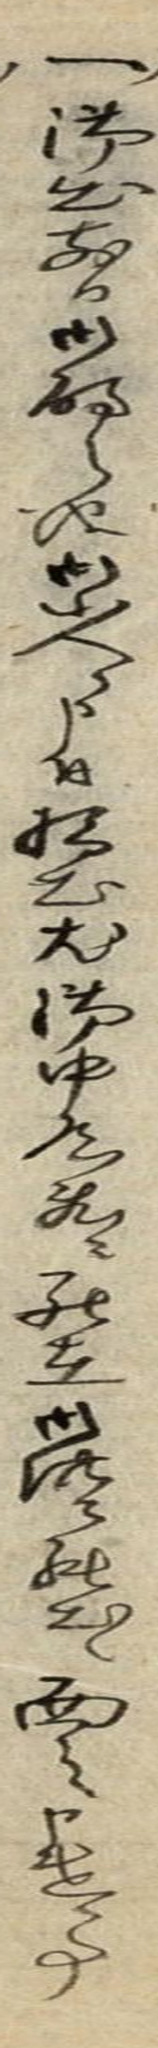一御出前日御触之儀御小人へ申付指出尤御中屋敷に罷在御供に罷出候面々へ申遣候事
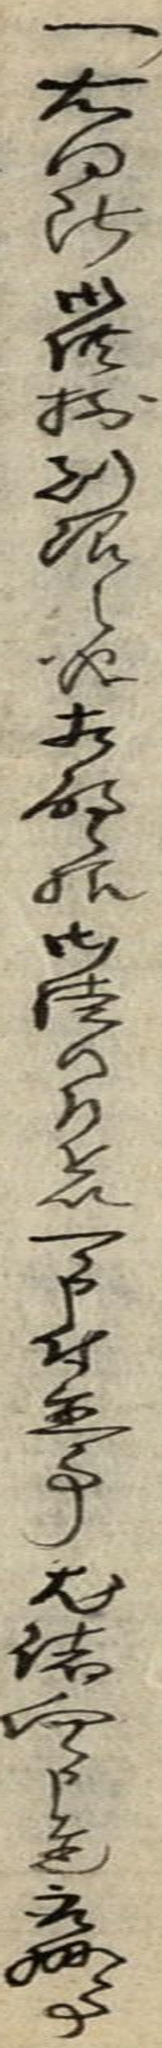一右同断御供揃刻限之儀相触候様御徒目付を以可申付置事尤諸向へ申達取扱候事
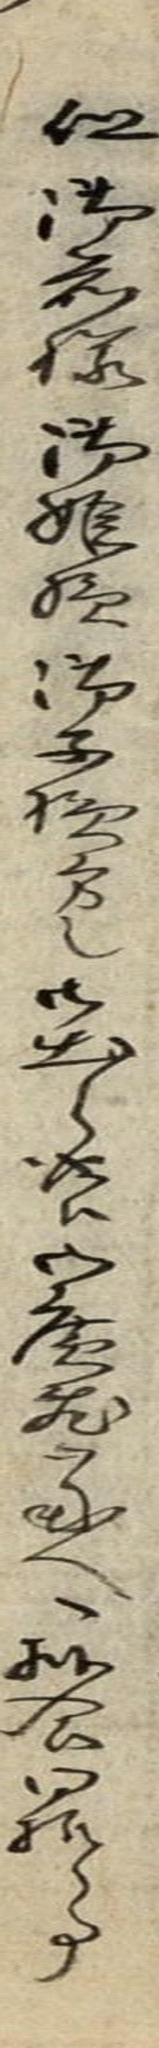但御前様御姫様御子様方之御出之儀は御広敷御用人へ掛合同様之事
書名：三都并道中之部
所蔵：福井県文書館 Fukui Prefectural Archives
